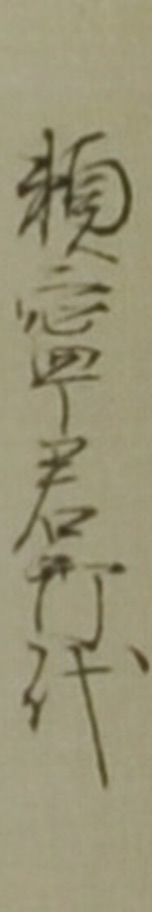頼寧君御代
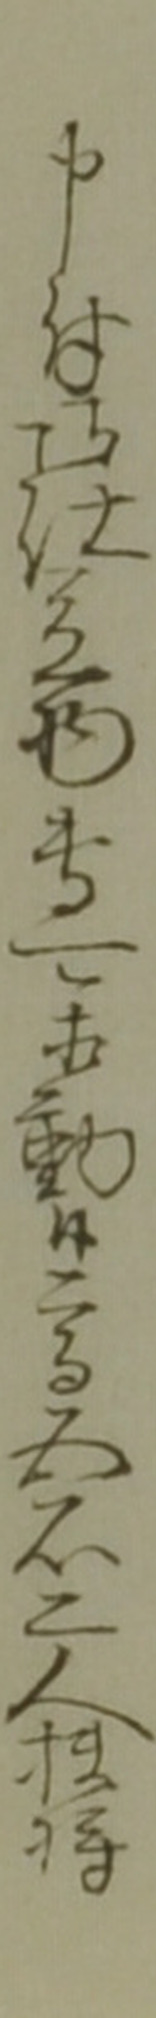申付御仕立物専可相勤候高五石二人扶持
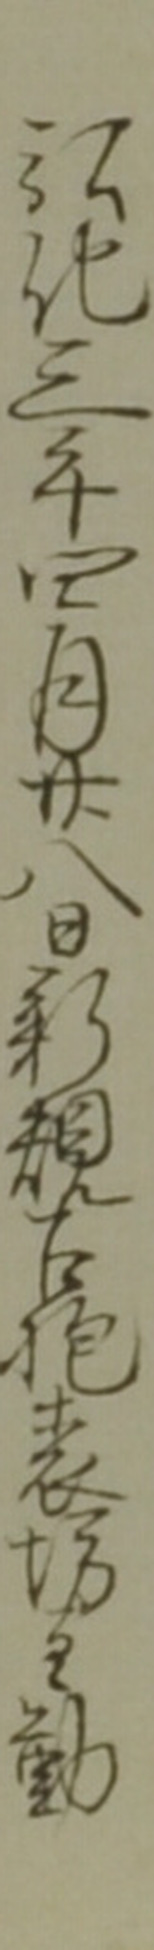一弘化三午四月廿八日新規召抱表坊主勤
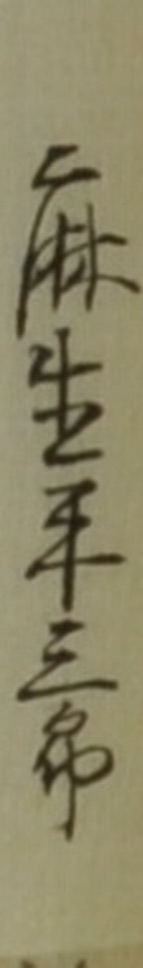麻生平三郎
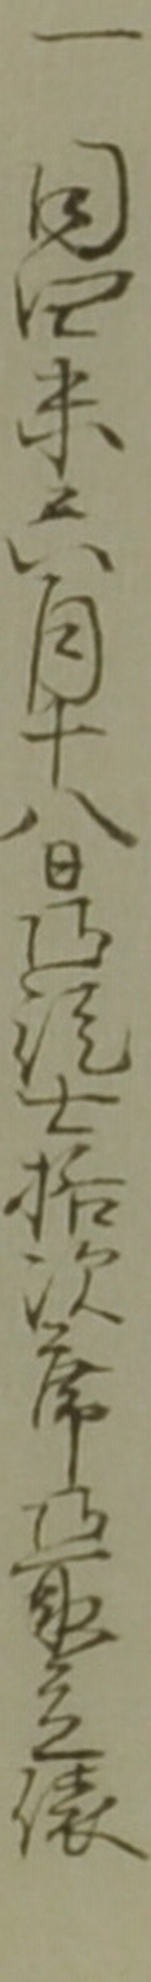一同四未六月十八日御徒士格次席御取立俵
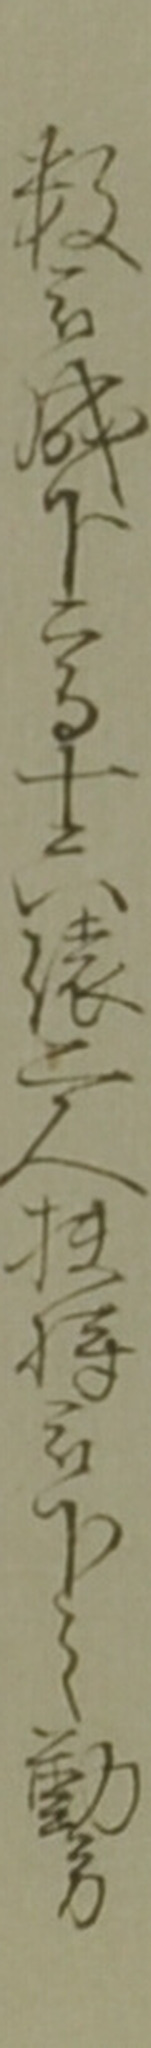数被成下高十六俵二人扶持被下之勤方
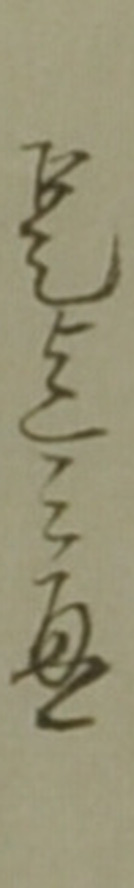是迄之通

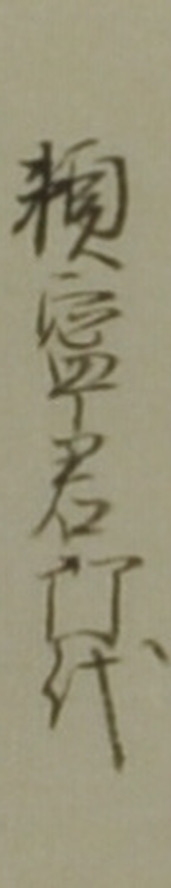頼寧君御代
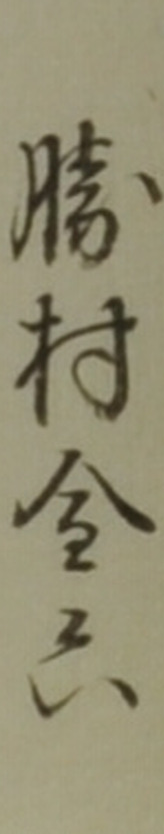勝村金六
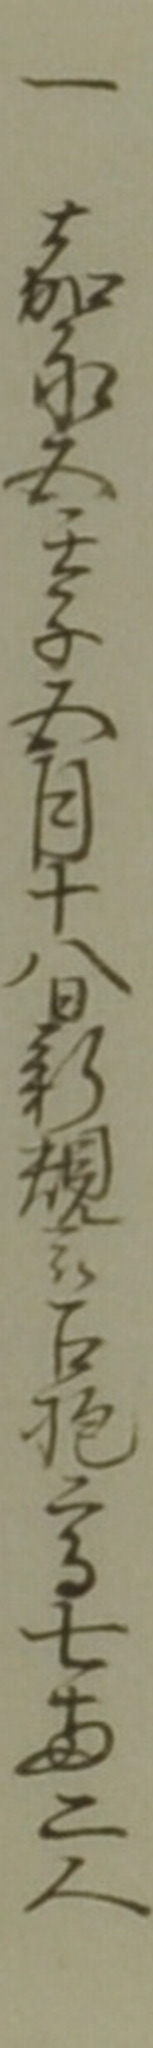一嘉永五壬子五月十八日新規被召抱高七両二人

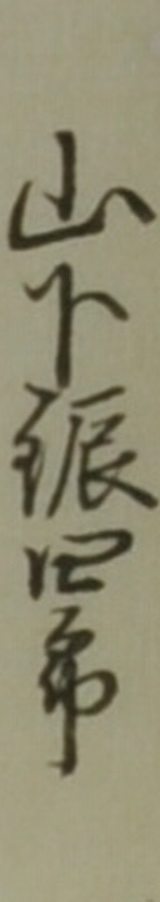山下鋠四郎
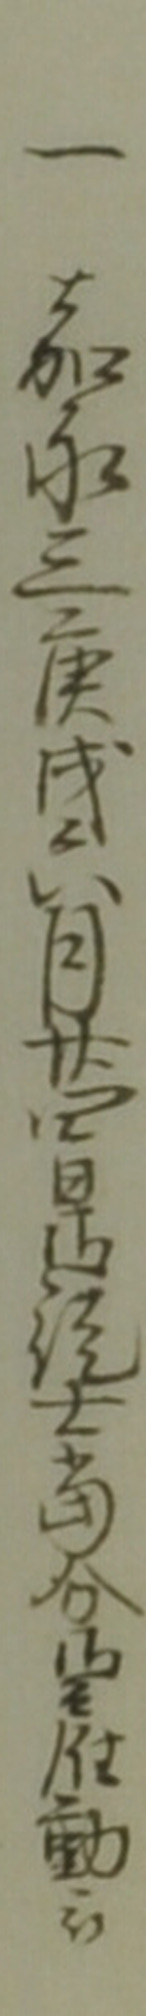一嘉永三庚戌六月廿四日御徒士当分御雇勤被
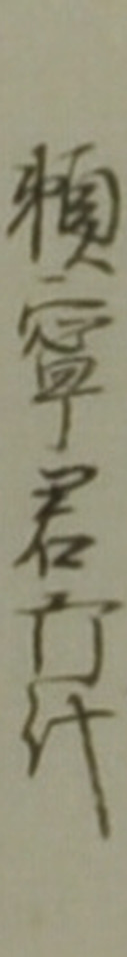頼寧君御代

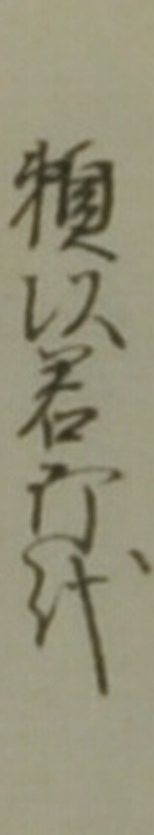頼以若御代
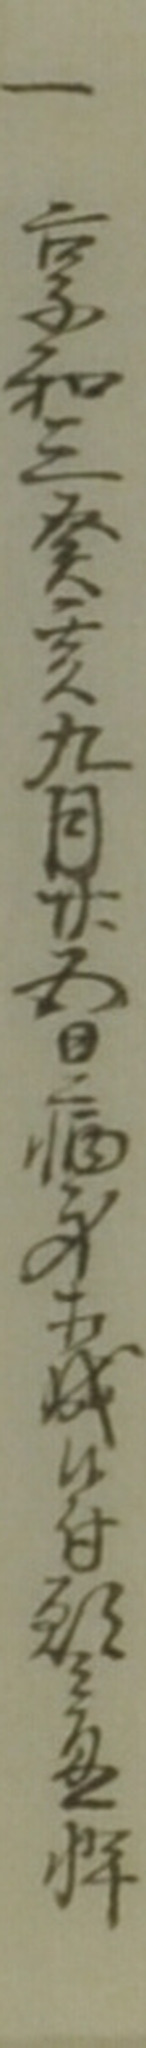一享和三癸亥九月廿五日病身相成候付願之通忰
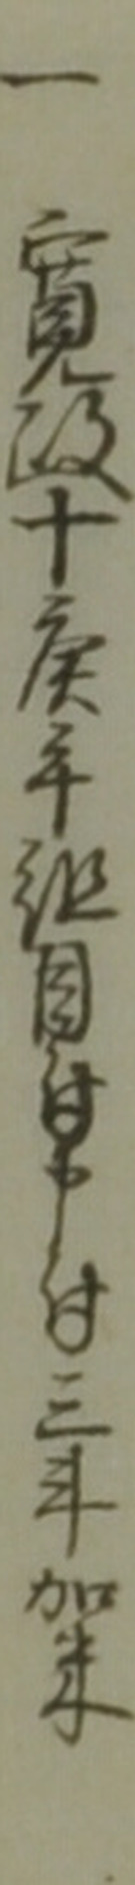一寛政十庚午組目付申付三斗加米
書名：無足諸士勤仕録（八）
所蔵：伊那市立高遠町図書館・合同会社AMANE
